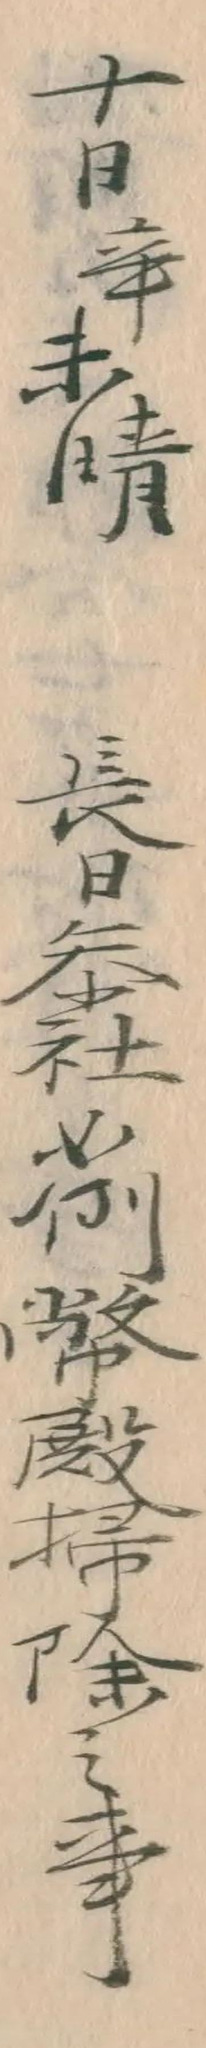十日辛未晴長日参社如例幣殿掃除之事
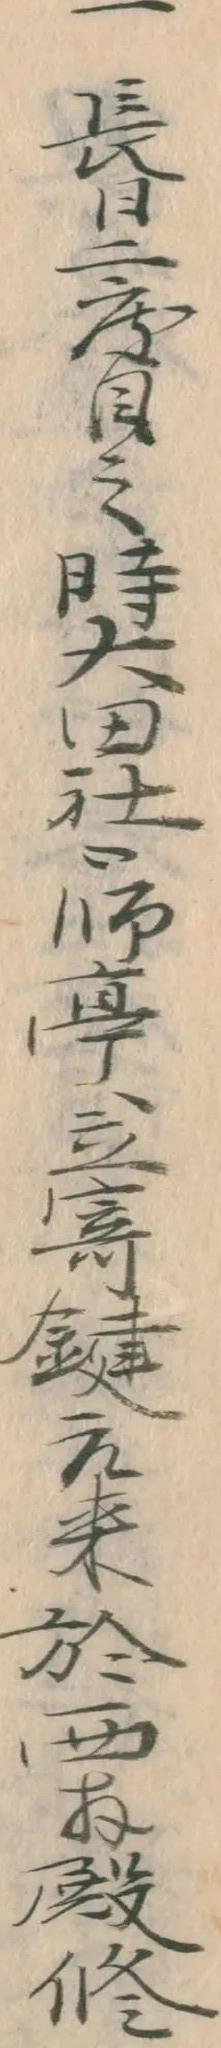一長月二度自之時大田社御師亭へ立寄鍵取来於西拝殿修
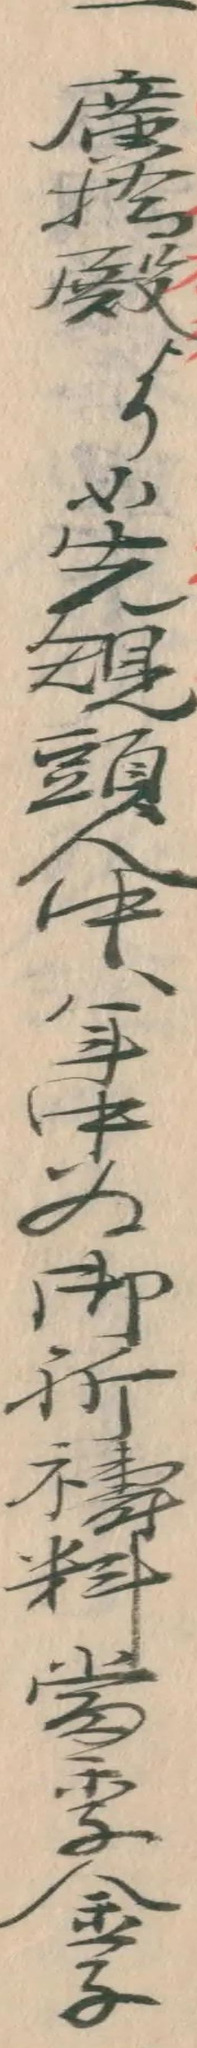一廣橋殿より如先規頭人中へ年中為御祈祷料當季金子
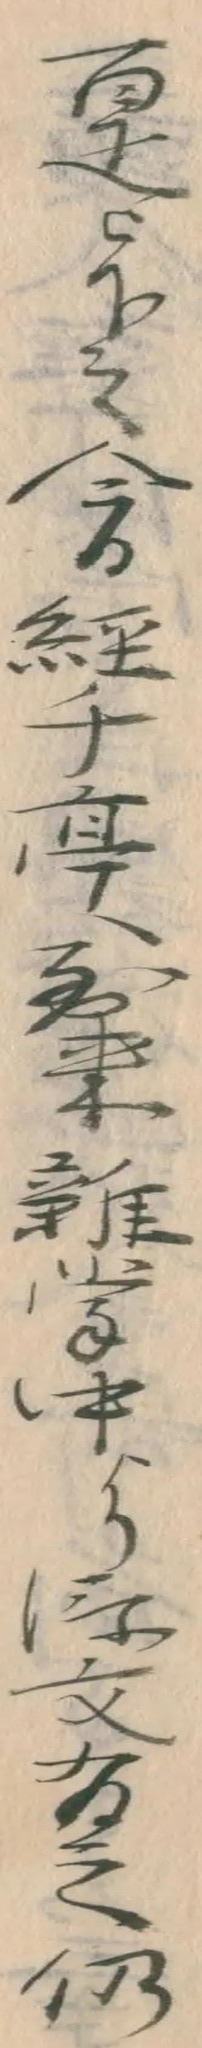百疋被下之今日経千亭へ到来雑掌中より添文有之仍
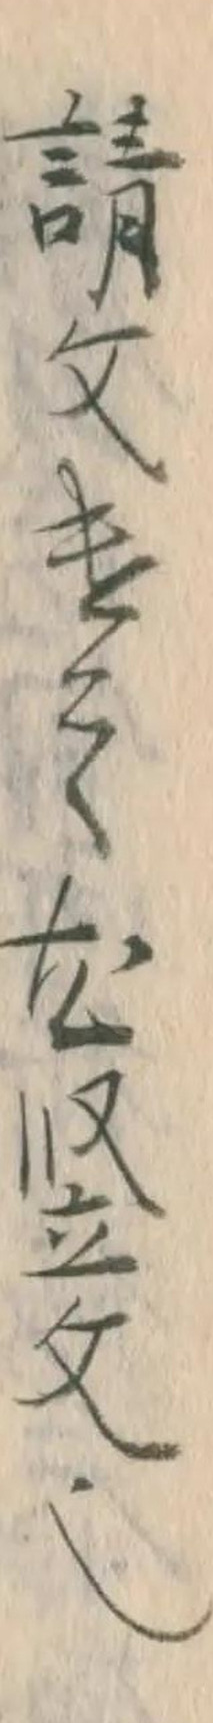請文遣之尤堅文也
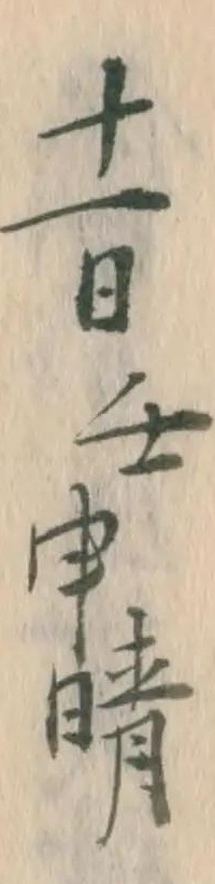十一日壬申晴

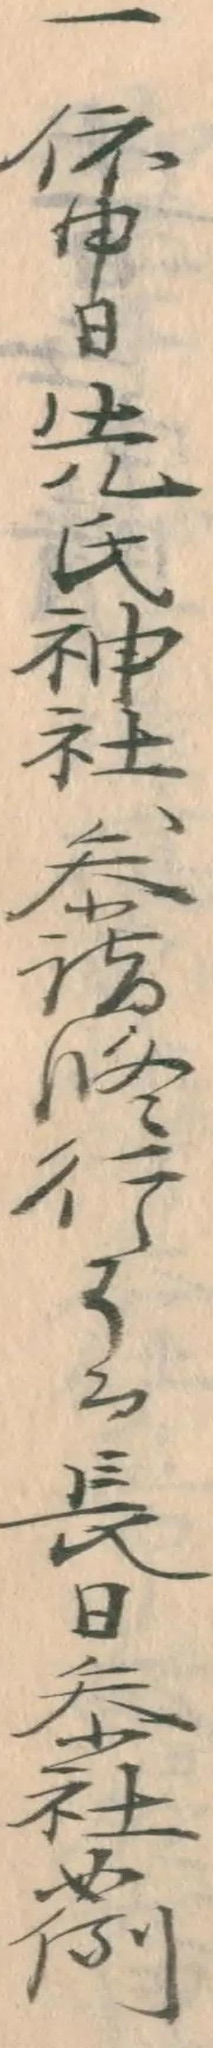一依申日先氏神社へ参詣修行了而長日参社如例
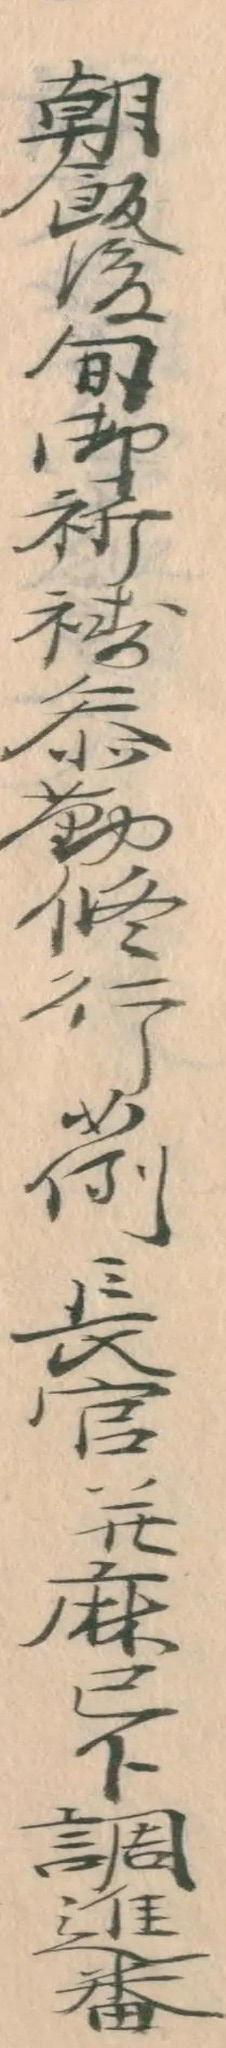一朝飯後旬御祈祷参勤修行如例長官并麻已下調進番
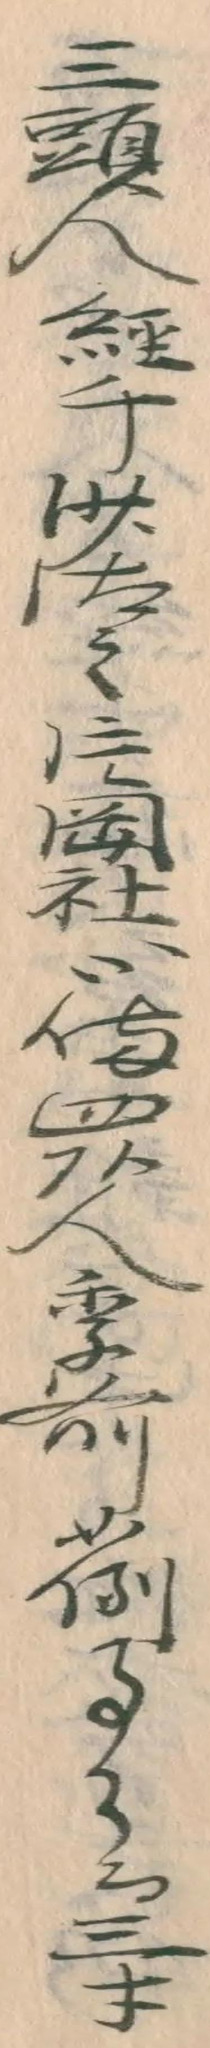三頭人経千沙汰之片岡社へ御備四頭人季前如例事了而三寸
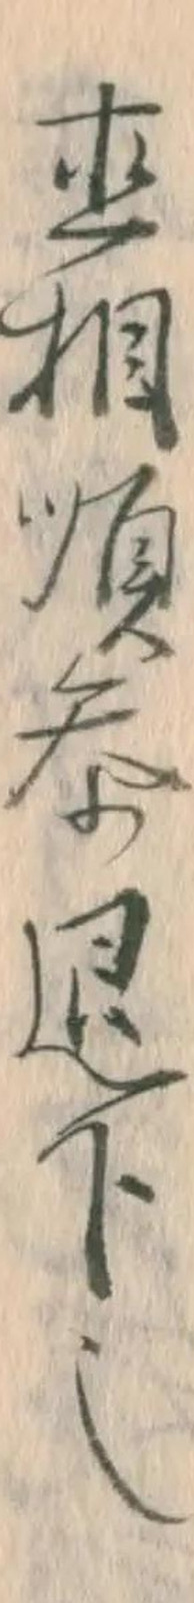直相順参退下也
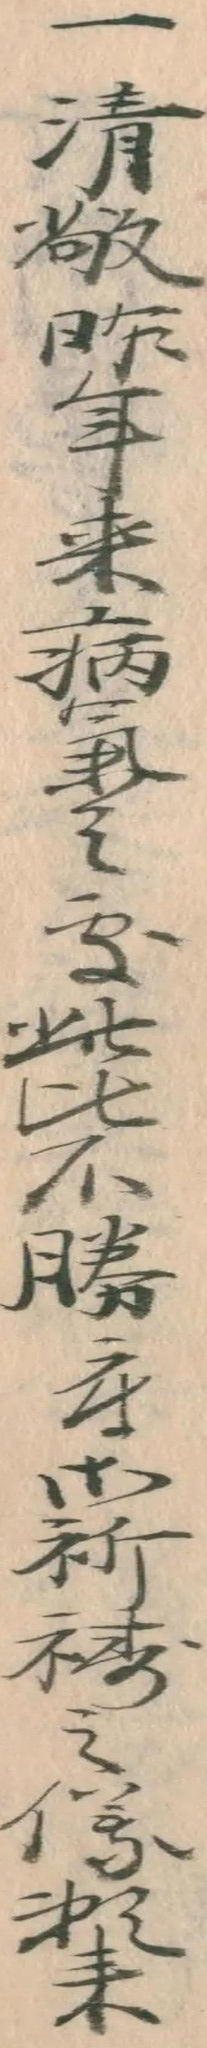一清敬昨年来病氣之處此比不勝ニ付御祈祷之儀頼来
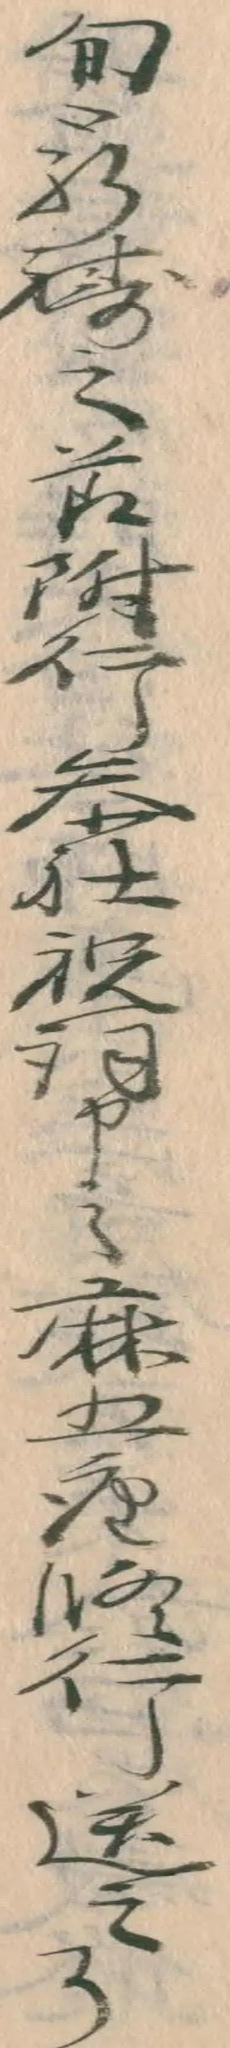旬御祈祷之節附仕参社祝詞申之麻五座修行送之了
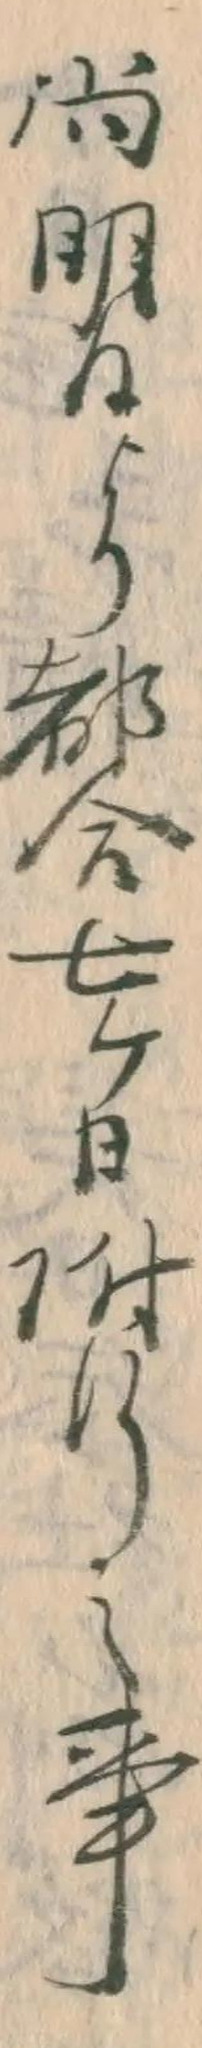尚明日より都合七ケ日附行之事
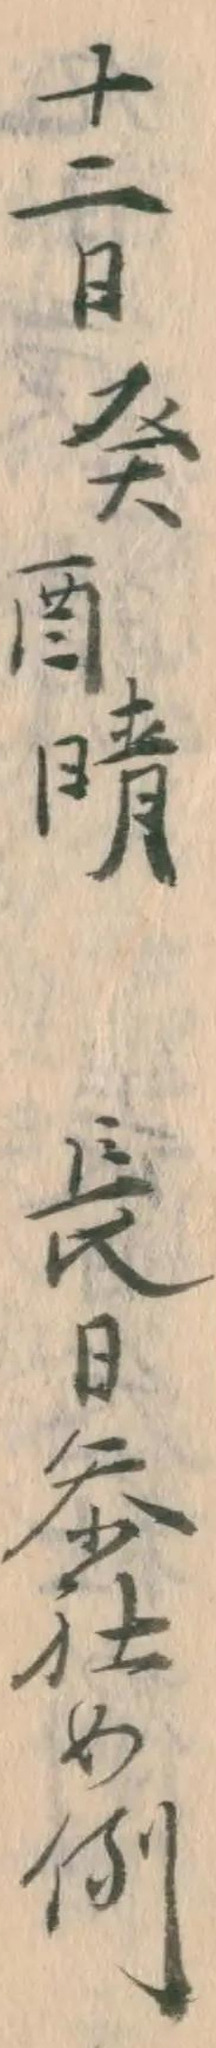十二日癸酉晴長日参社如例
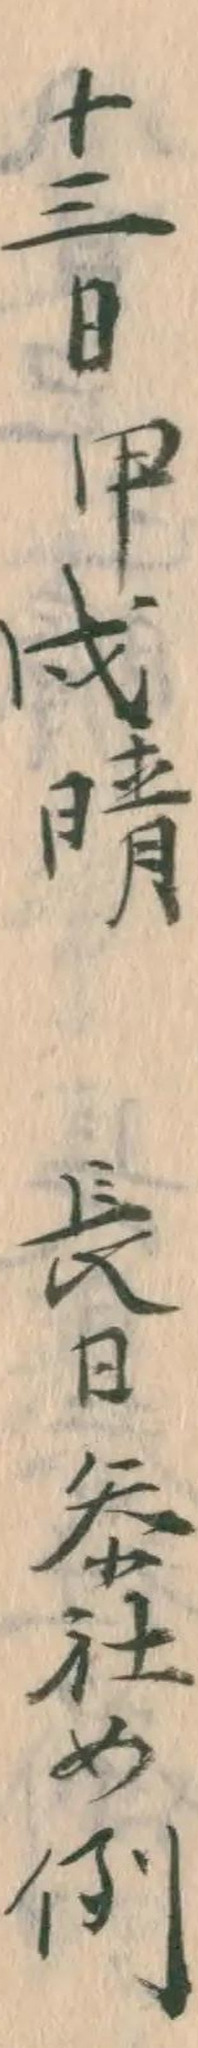十三日甲戌晴長日参社如例
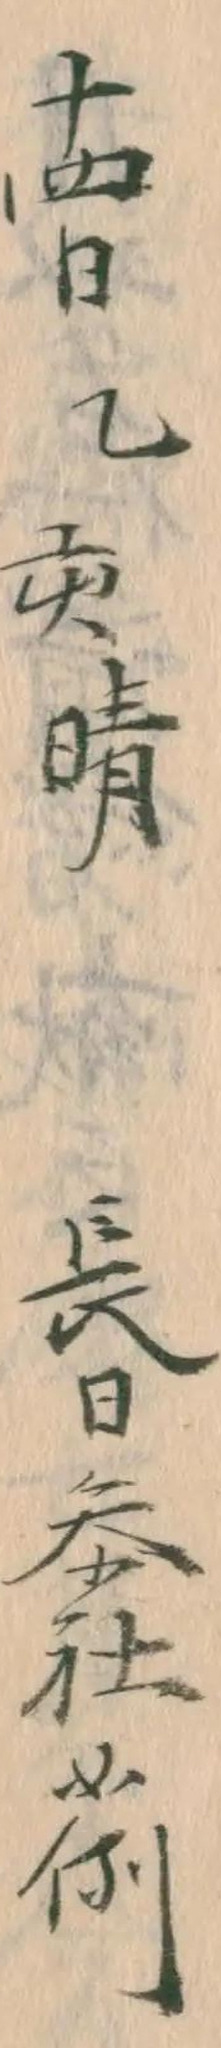十四日乙亥晴長日参社如例
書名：賀茂社記録. 第73冊
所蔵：国立国会図書館 National Diet Library, JAPAN
